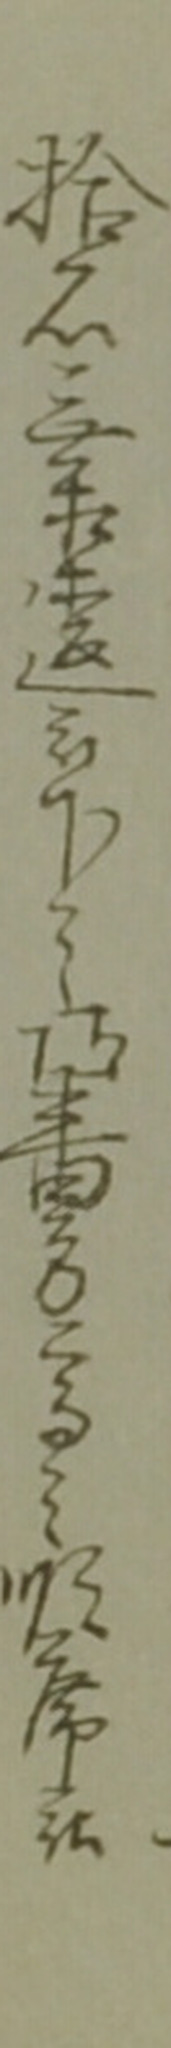拾石無相違被下之御番方高之順席被
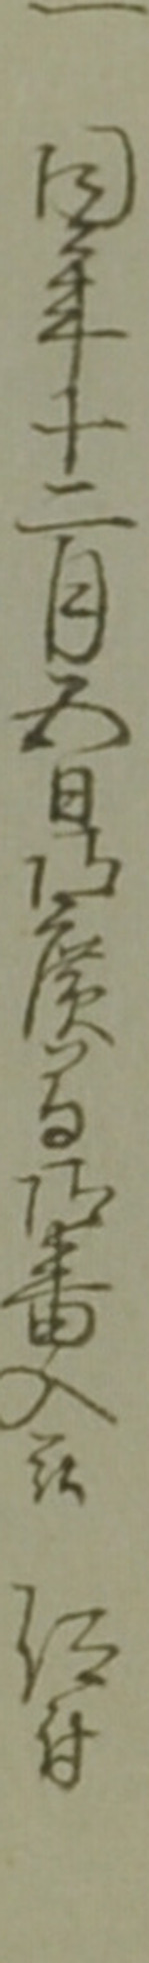一同年十二月五日御広間御番入被仰付

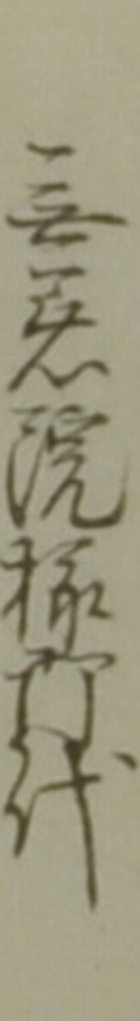無着院様御代
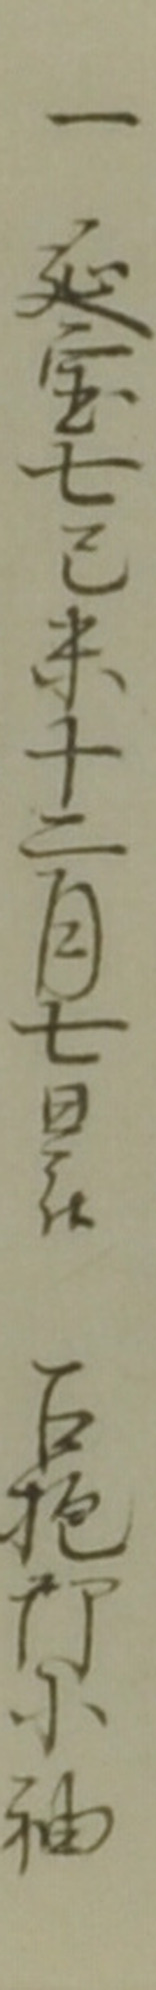一延宝七己未十二月七日被召抱小袖
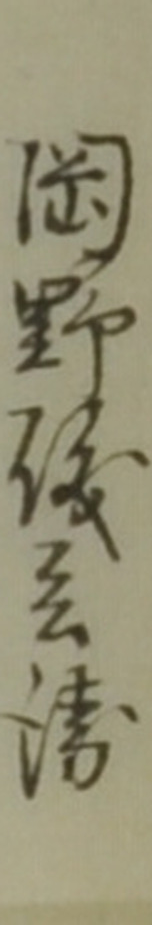岡野儀兵衛
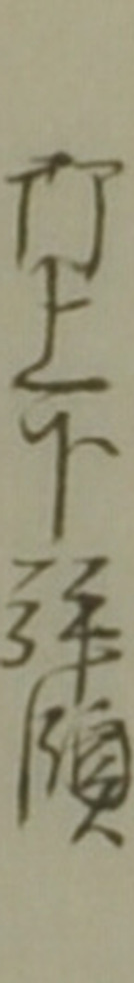御上下拝領
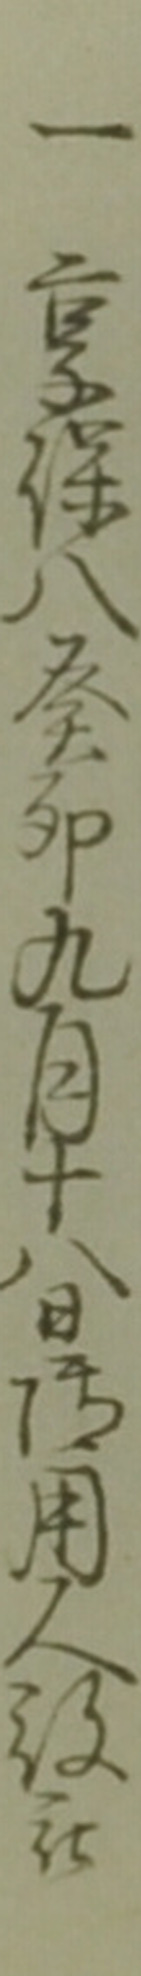一享保八癸卯九月十八日御用人役被
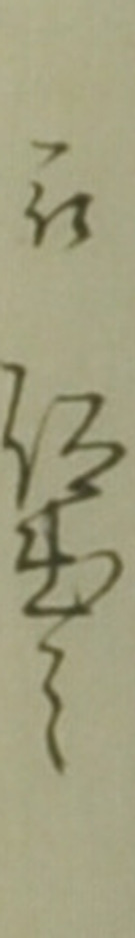被仰出候
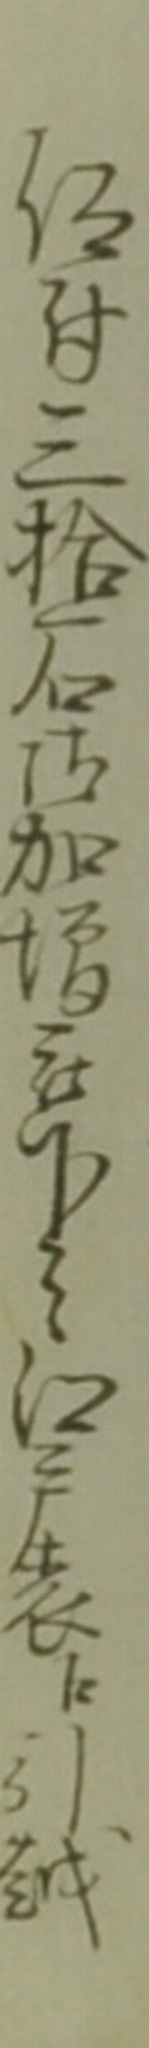仰付三拾石御加増被下候江戸表江引越

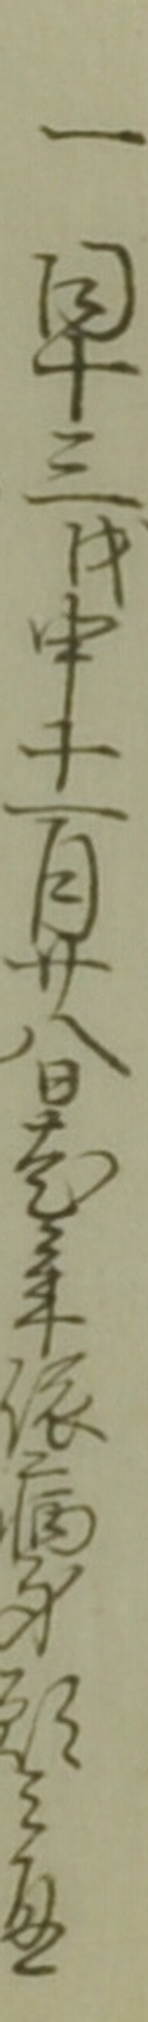一同十三戊申十一月廿八日老年依病身願之通
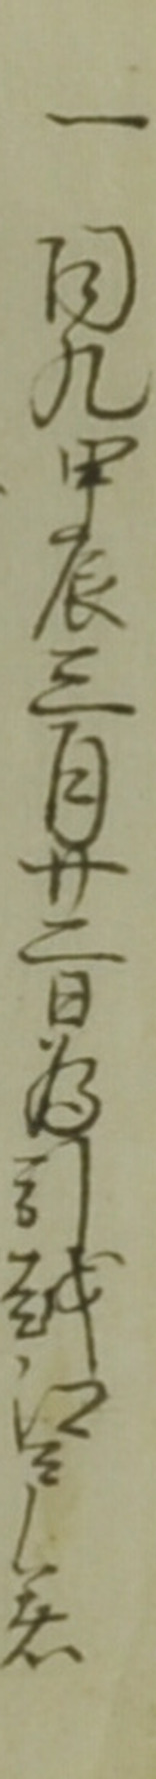一同九甲辰三月廿二日為引越江戸着
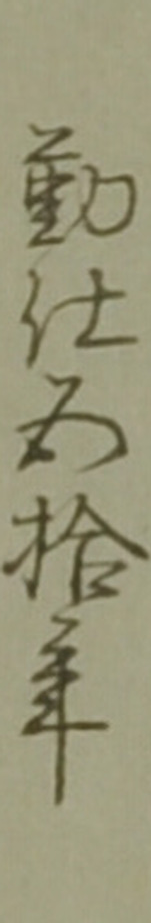勤仕五拾年
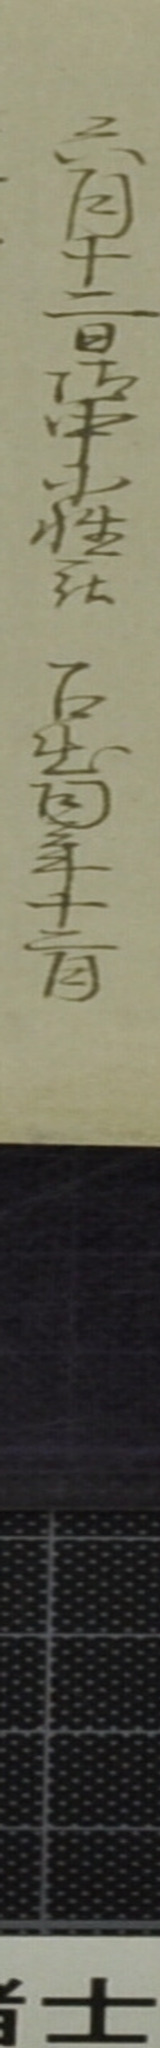六月十二日御中小性被召出同年十二月
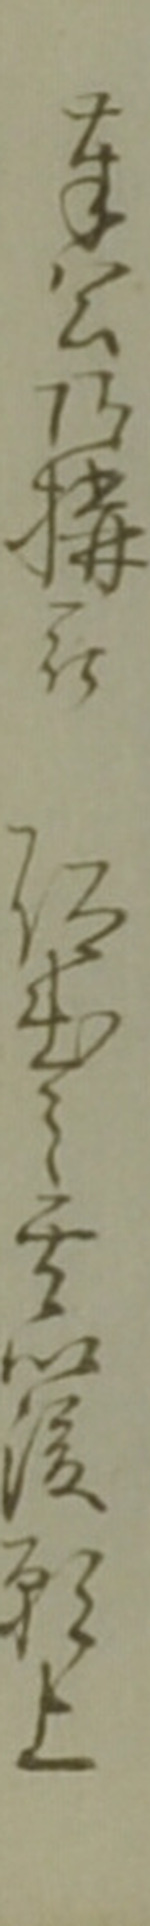奉公御構被仰出之其以後願上
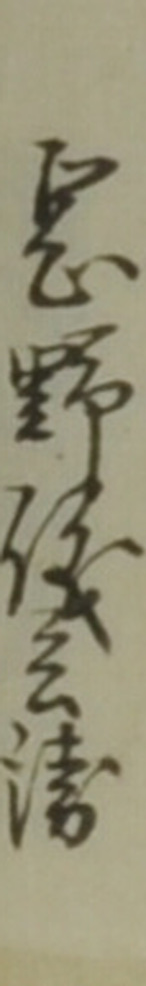岡野儀兵衛
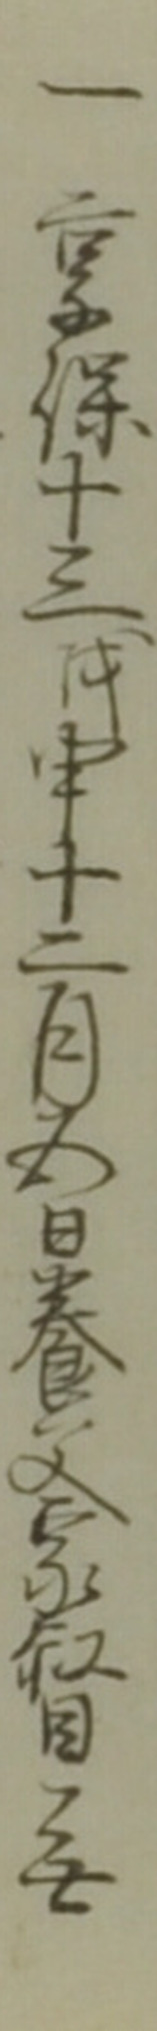一享保十三戊申十二月五日養父家督無
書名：給人諸士勤仕録（三）
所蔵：伊那市立高遠町図書館・合同会社AMANE
